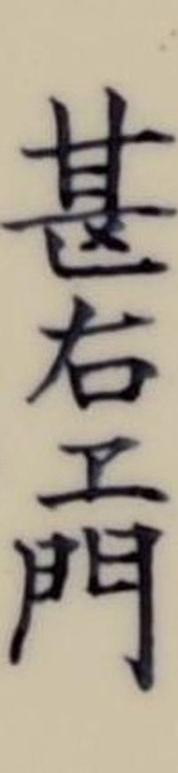甚右エ門
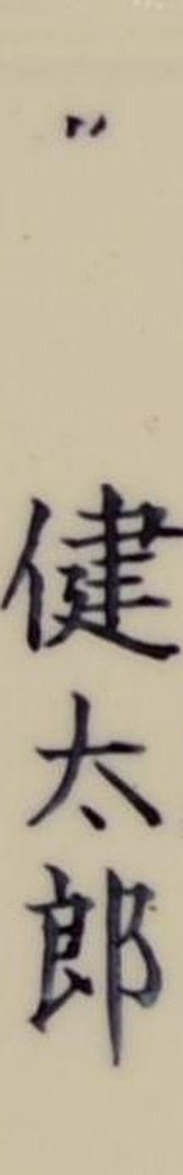健太郎
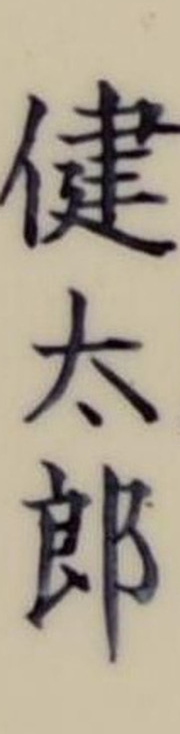健太郎
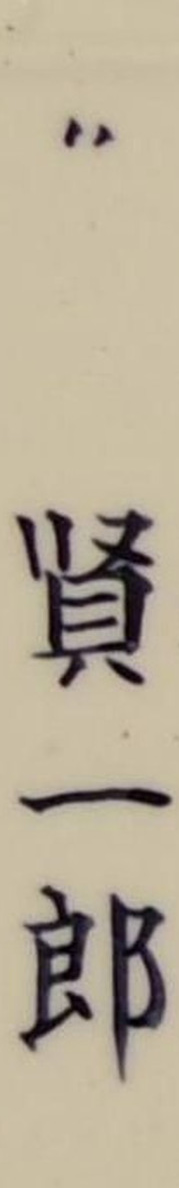賢一郎
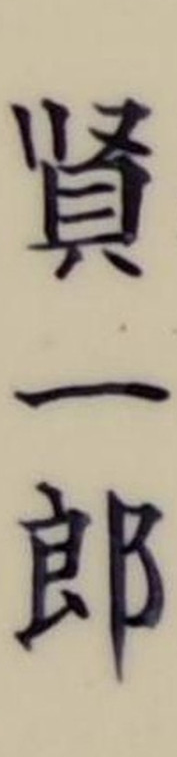賢一郎
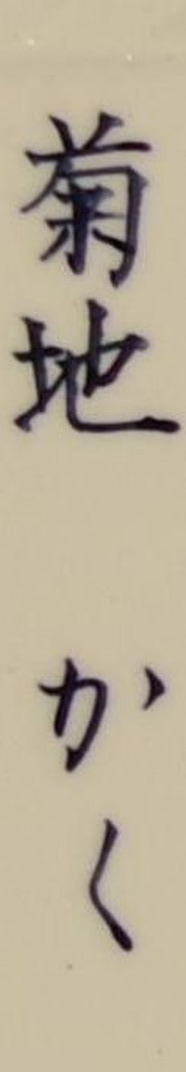菊地かく

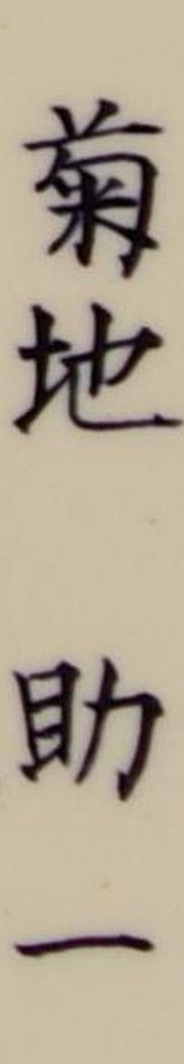菊地助一
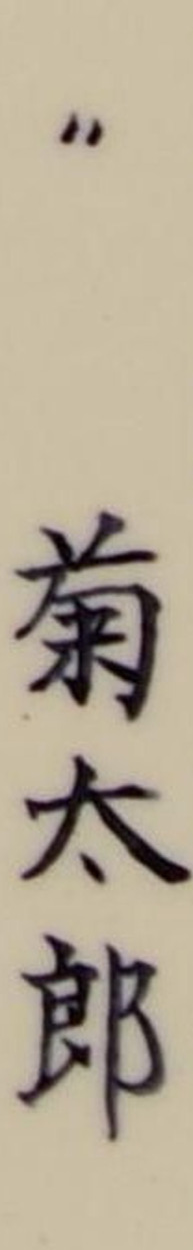菊太郎
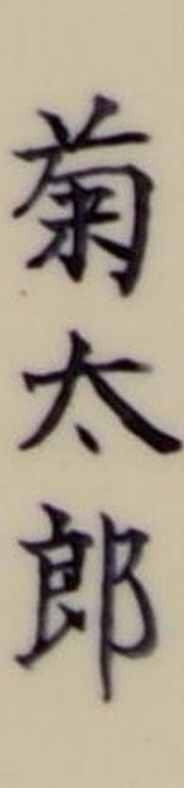菊太郎
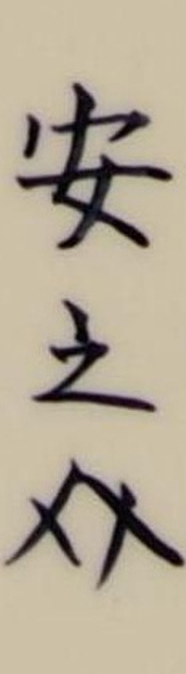安之介
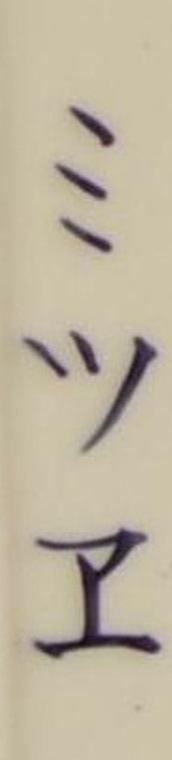ミツヱ

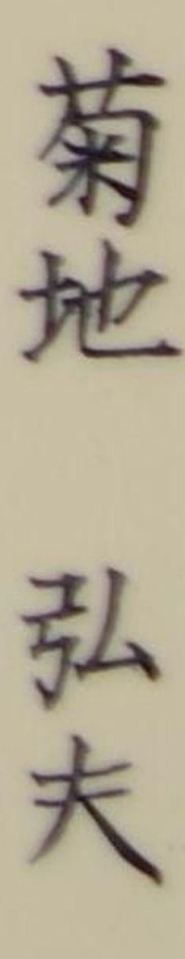菊地弘天
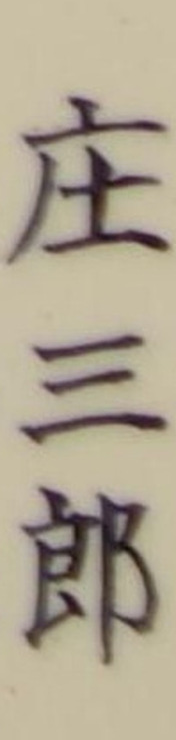庄三郎
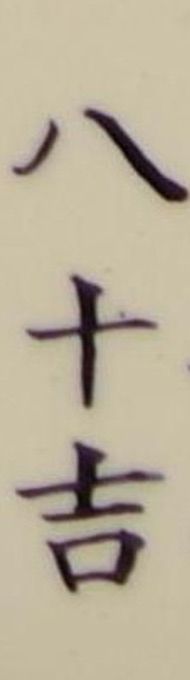八十吉
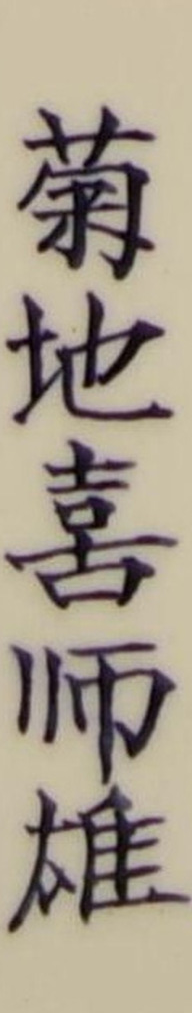菊地喜師雄
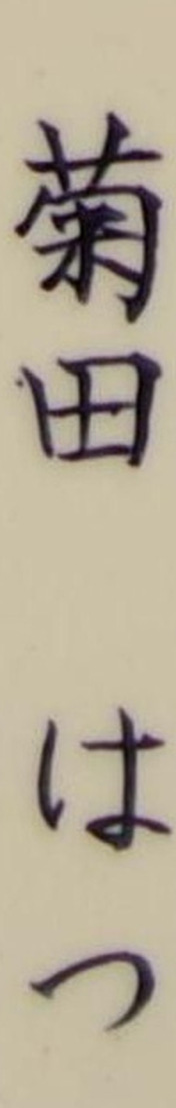菊田はつ
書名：E~L
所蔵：高野山金剛峯寺
